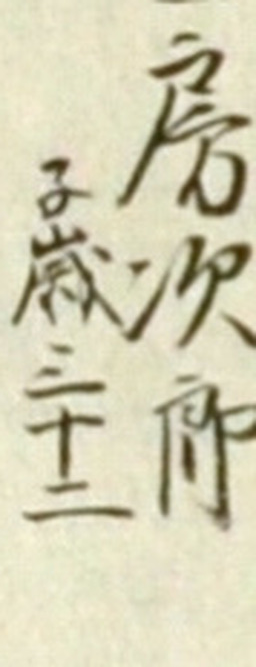子歳三十二
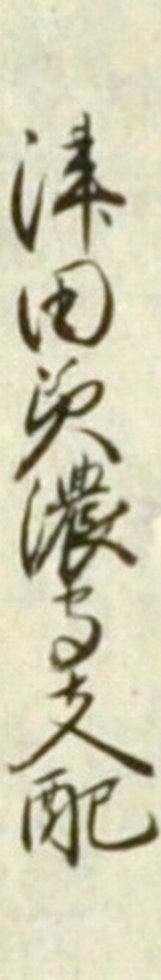津田美濃守支配
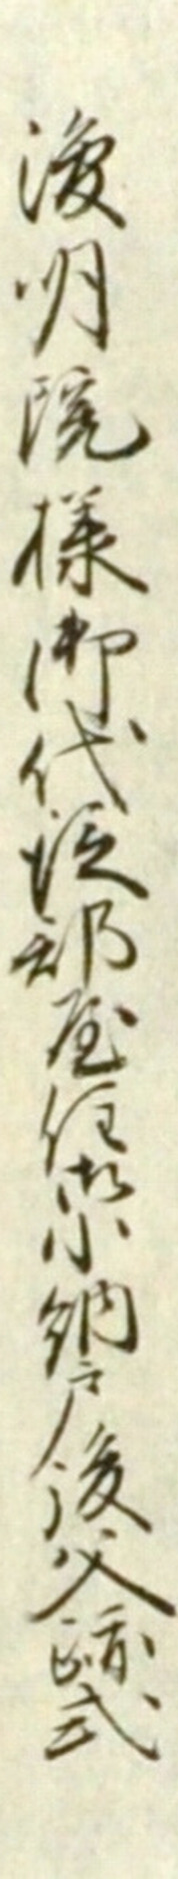浚明院様御代従部屋住御小納戸後父跡式
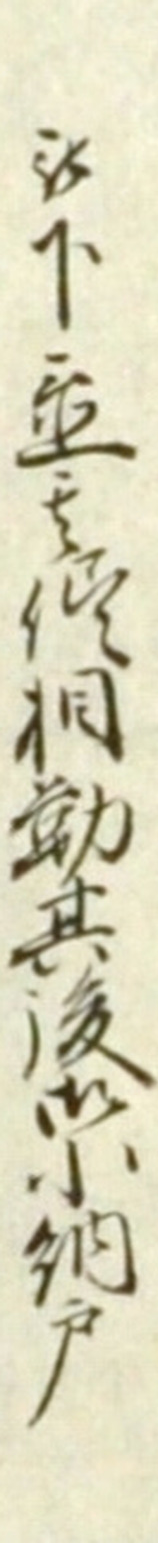被下置其侭相勤其後御小納戸
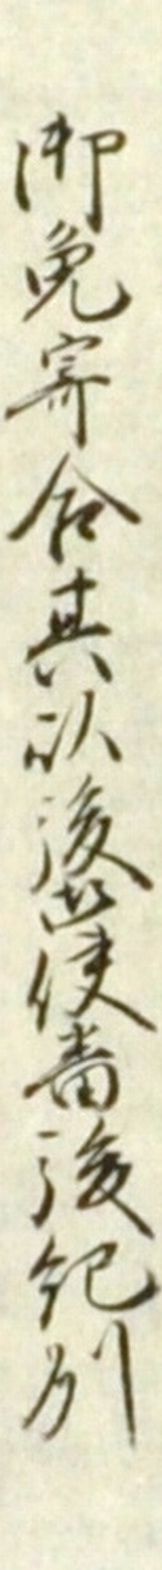御免寄合其以後御使番後紀州
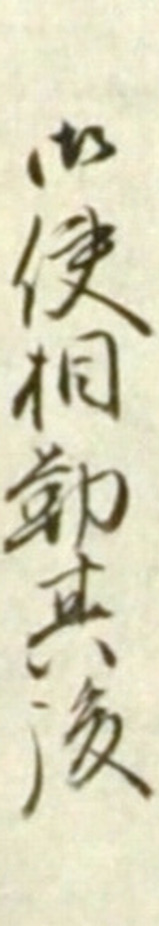御使相勤其後
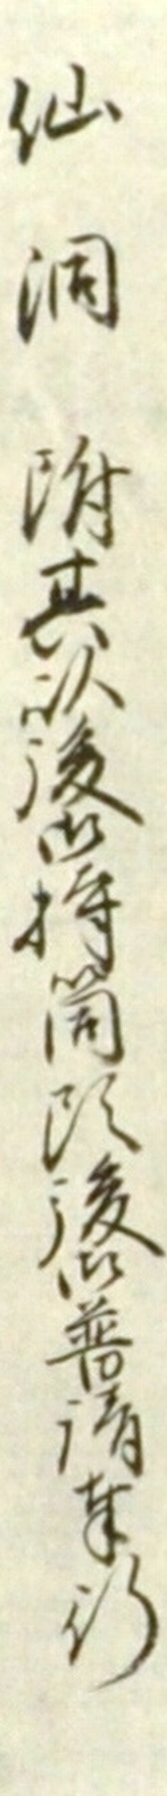仙洞附其以後御持筒頭後御普請奉行
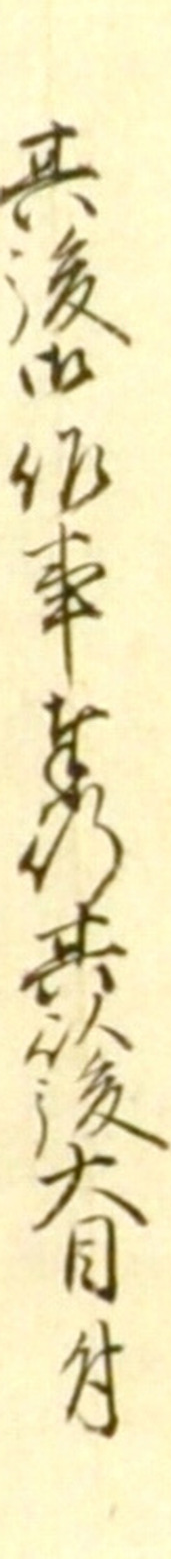其後御作事奉行其以後大目付
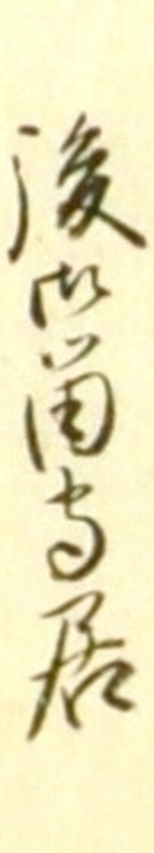後御留守居
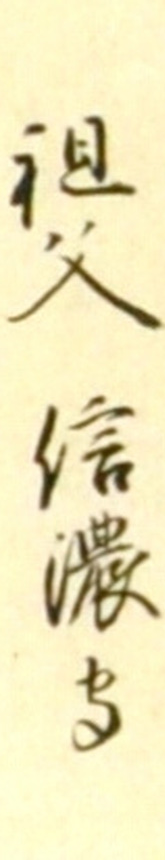祖父信濃守
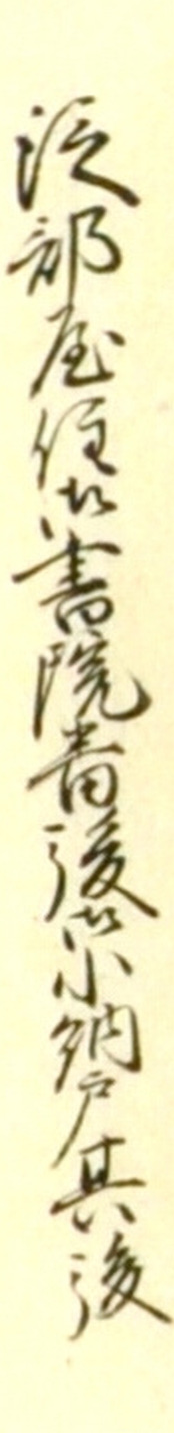従部屋住御書院番後御小納戸其後

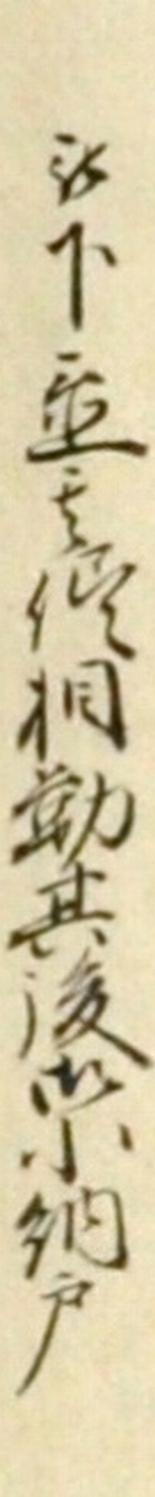被下置其の侭相勤其後御小納戸
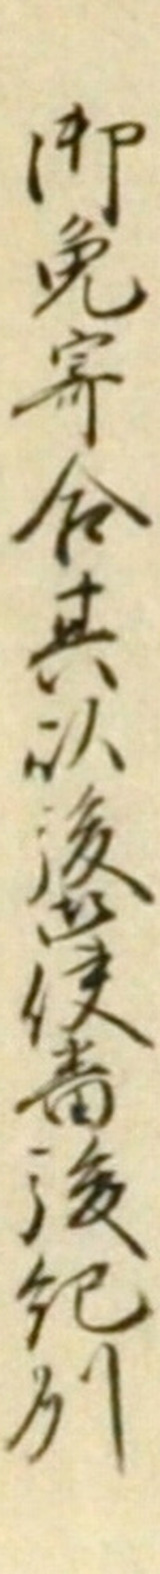御免寄合其以後御使番後紀州
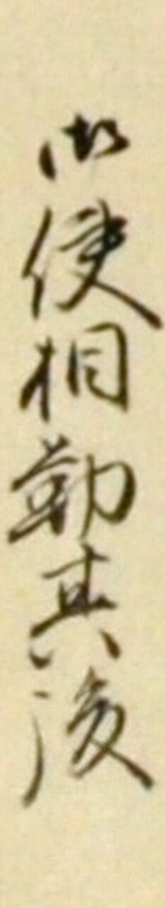御使相勤其後
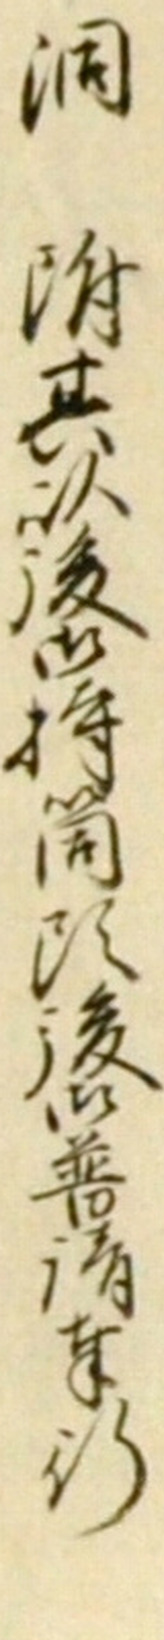仙洞附其以後御持筒頭後御普請奉行
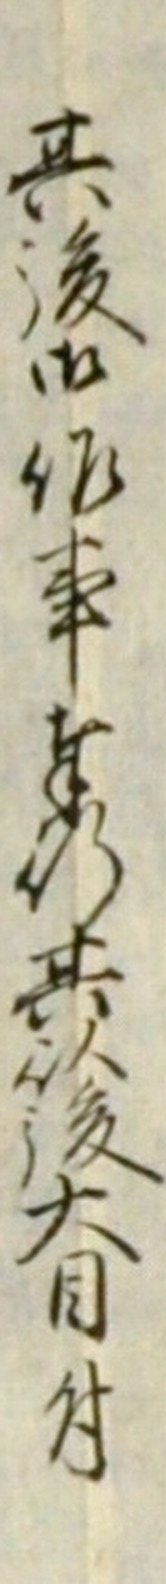其後御作事奉行其以後大目付
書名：若年寄御役中御調書付
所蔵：伊那市立高遠町図書館・合同会社AMANE
